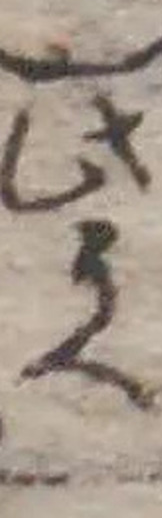此うへ
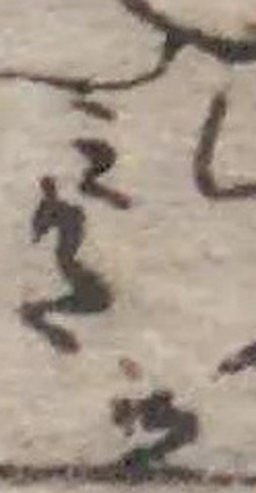みかた

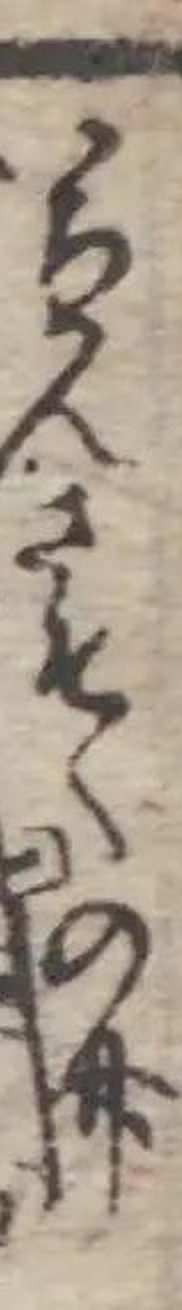いちかんさそくの介
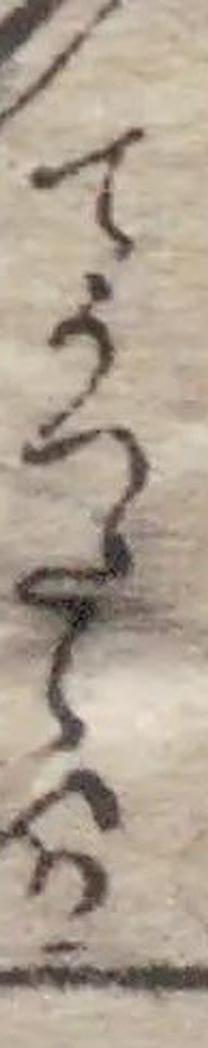てうつたらいか
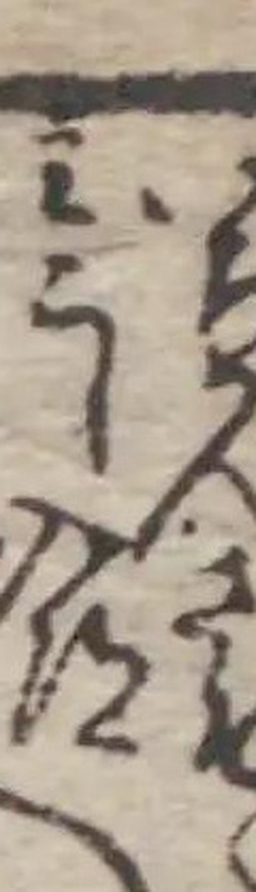みこし入道
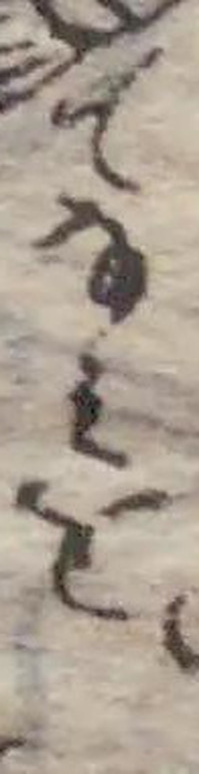てなみを
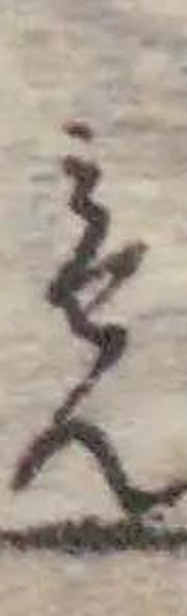みせん
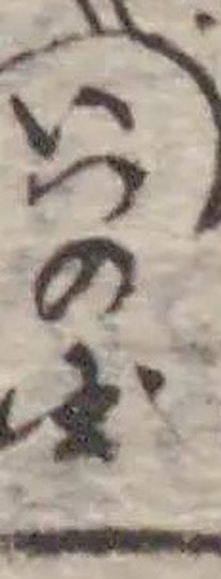いつの国
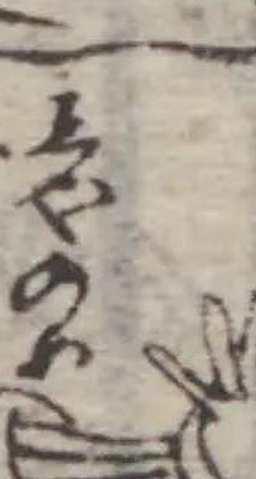しやのめ
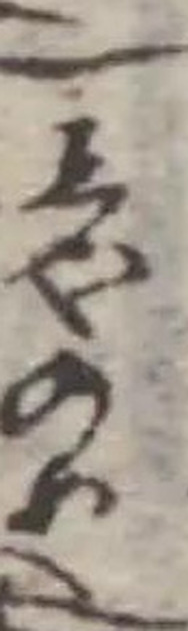しやのめ
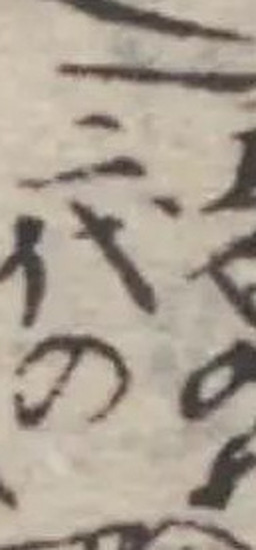二代の
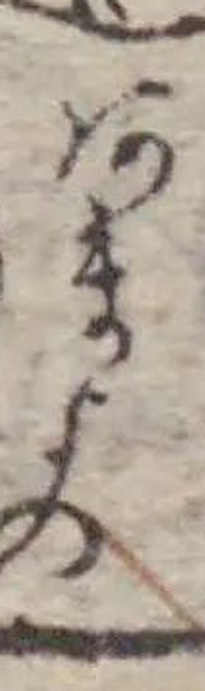あまよの
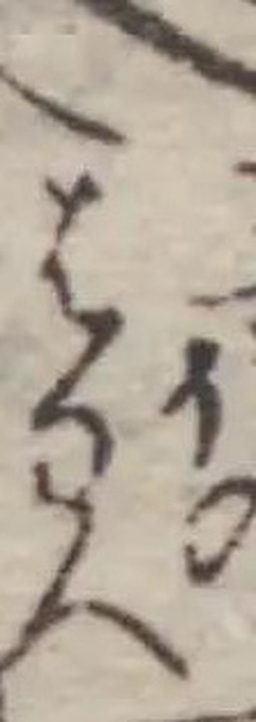はるへ
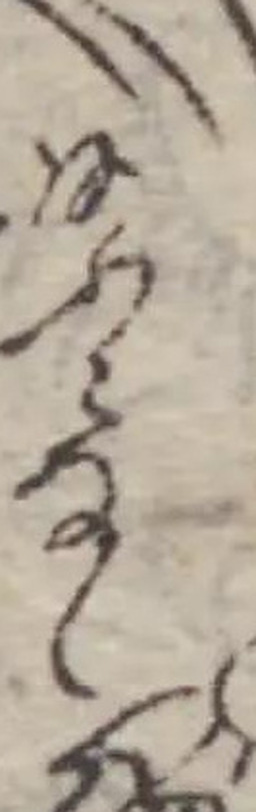あふらなし
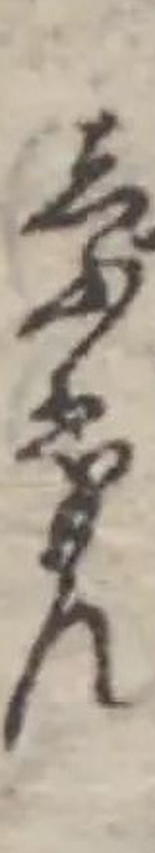しぶゑもん
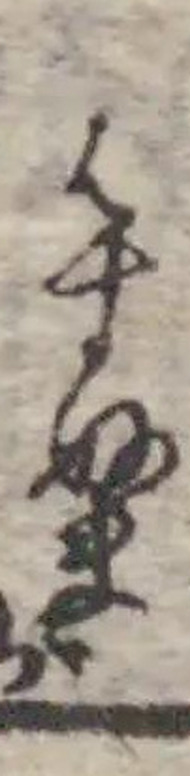はすぬまが
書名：化物三ツ目大ほうい 2巻
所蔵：国立国会図書館 National Diet Library, JAPAN
